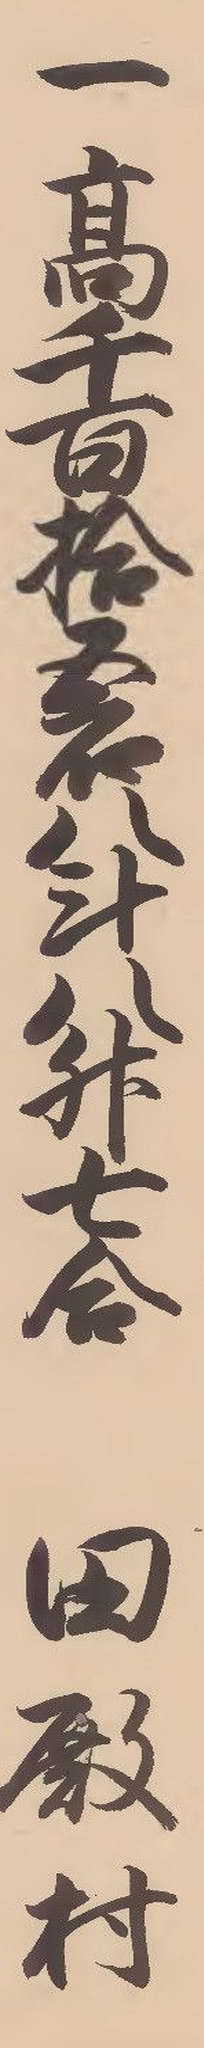一高千百拾五石八斗八升七合田殿村
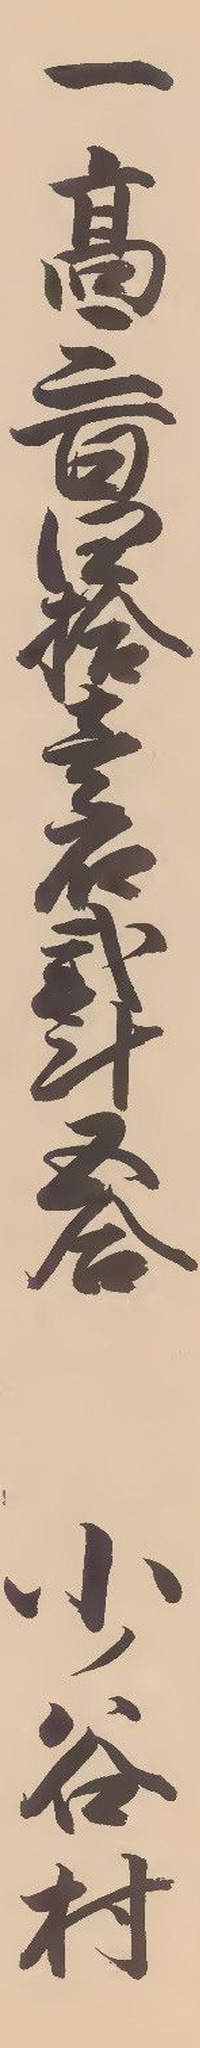一高三百四拾壱石弐斗五合小ノ谷村
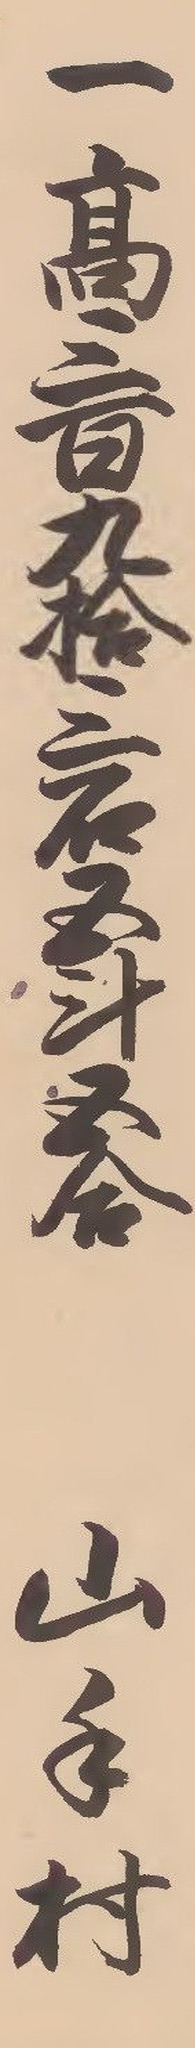一高三百九拾三石五斗五合山手村

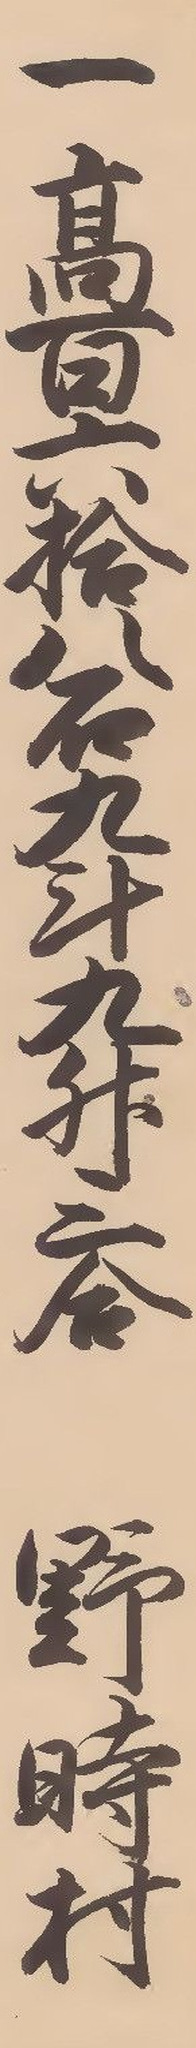一高百六拾八石九斗九升三合野時村
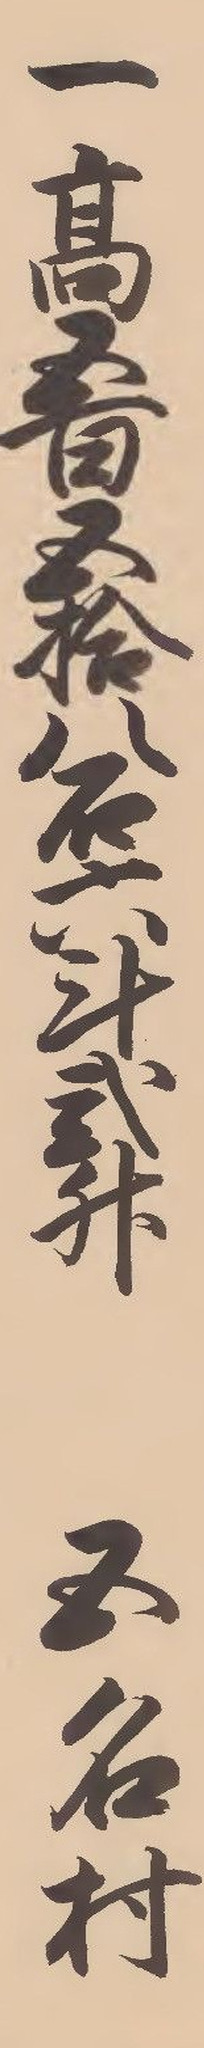一高五百五拾八石六斗弐升五名村
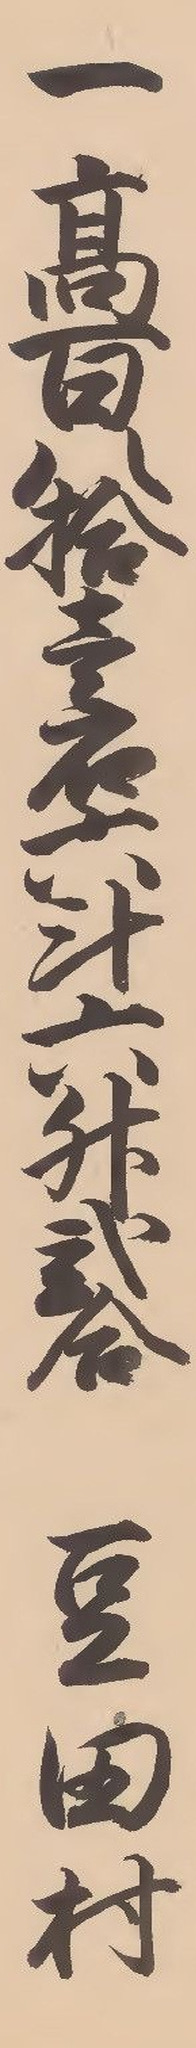一高百八拾壱石六斗六升弐合豆田村
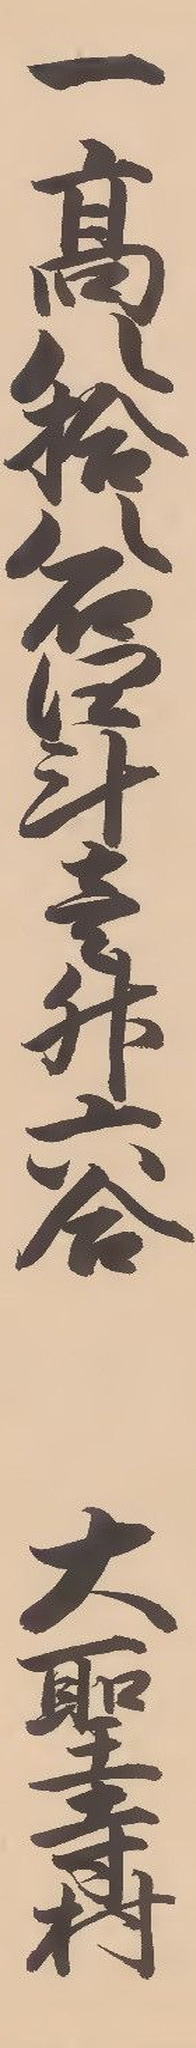一高八拾八石四斗壱升六合大聖寺村
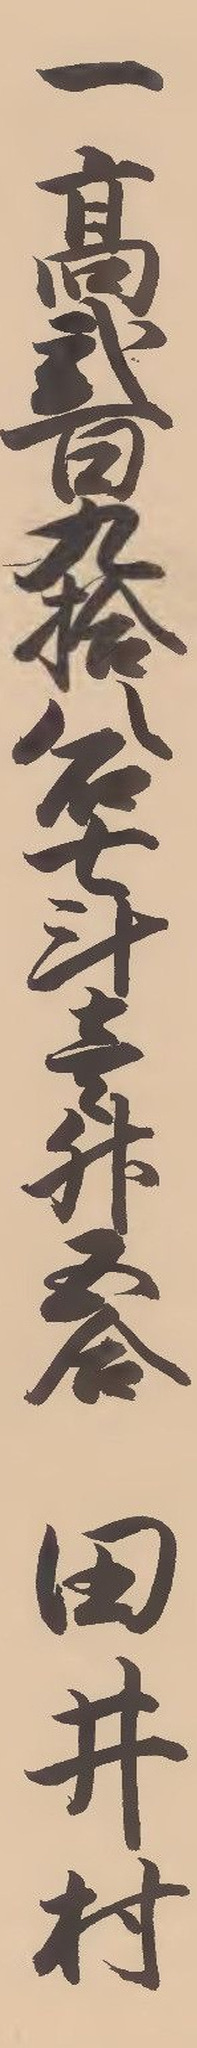一高弐百九拾八石七斗壱升五合田井村
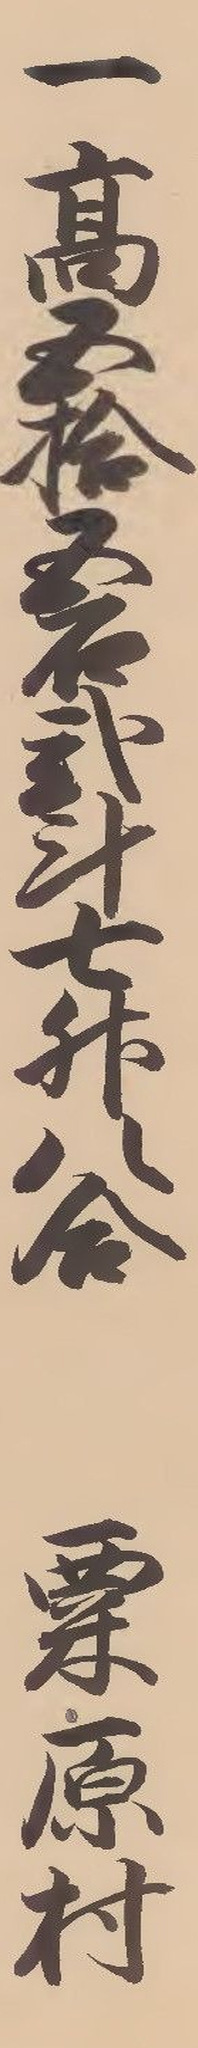一高五拾五石弐斗七升八合粟原村
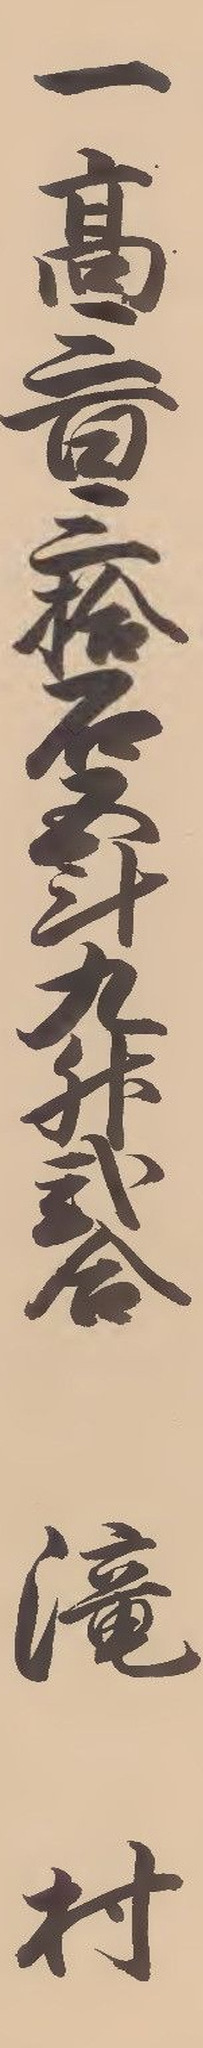一高三百三拾石五斗九升弐合滝村
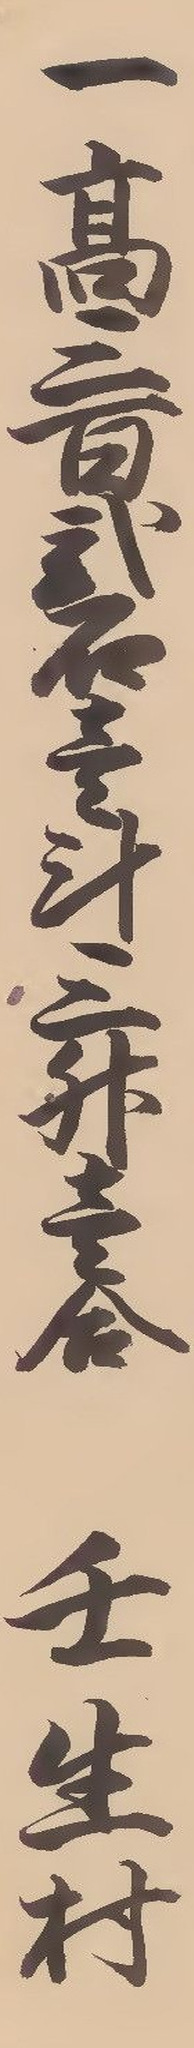一高三百弐石壱斗三升壱合壬生村

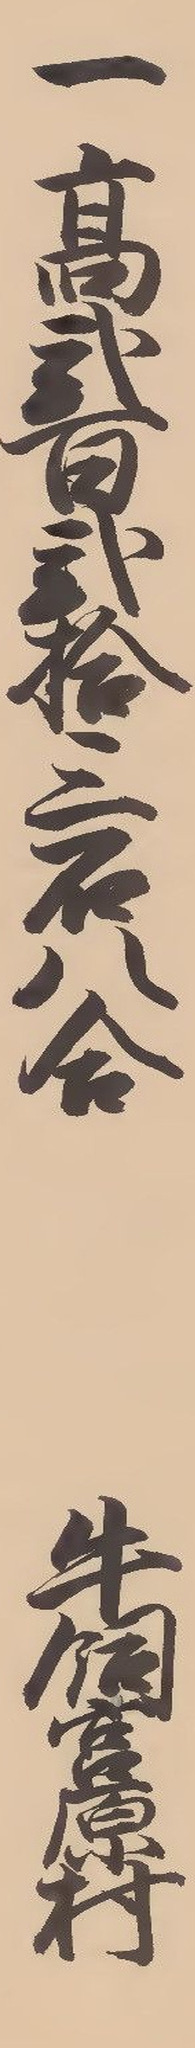一高弐百弐拾三石八合牛飼宮原村
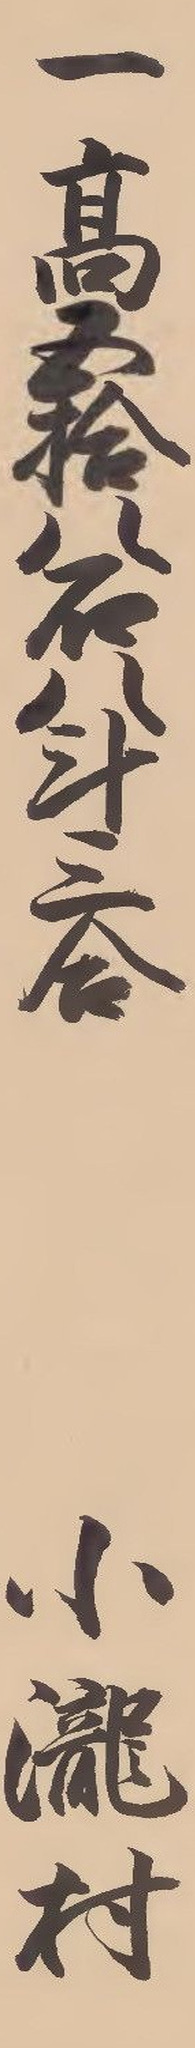一高五拾八石八斗三合小滝村
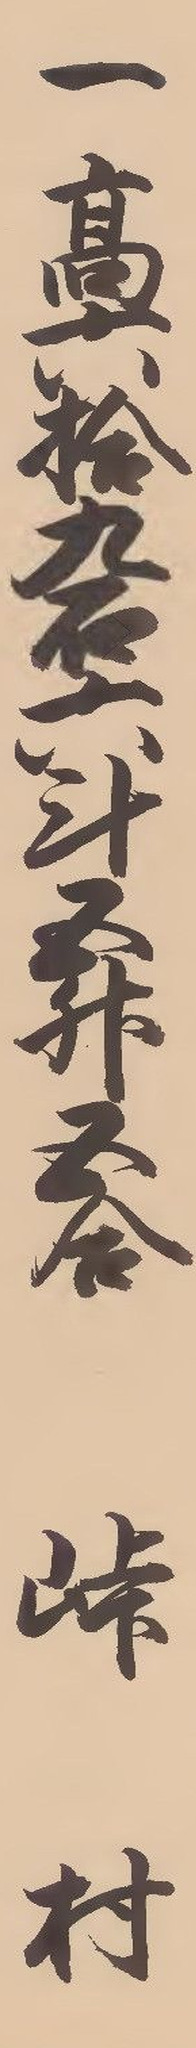一高六拾九石六斗五升五合峠村
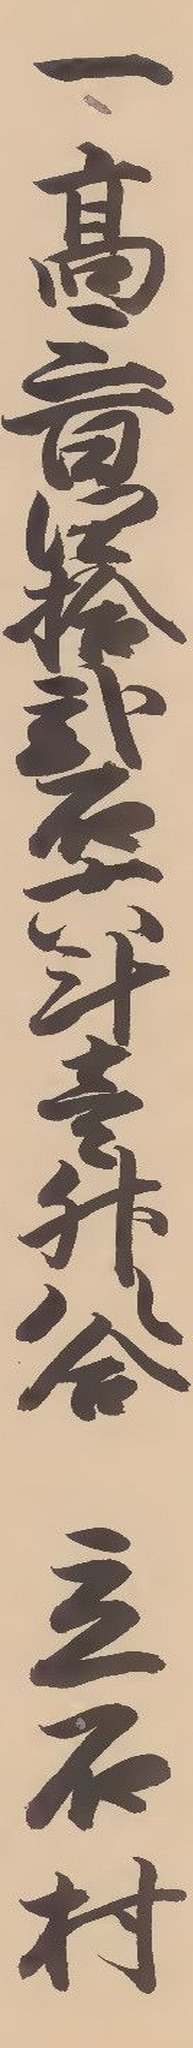一高三百四拾弐石六斗壱升八合立石村
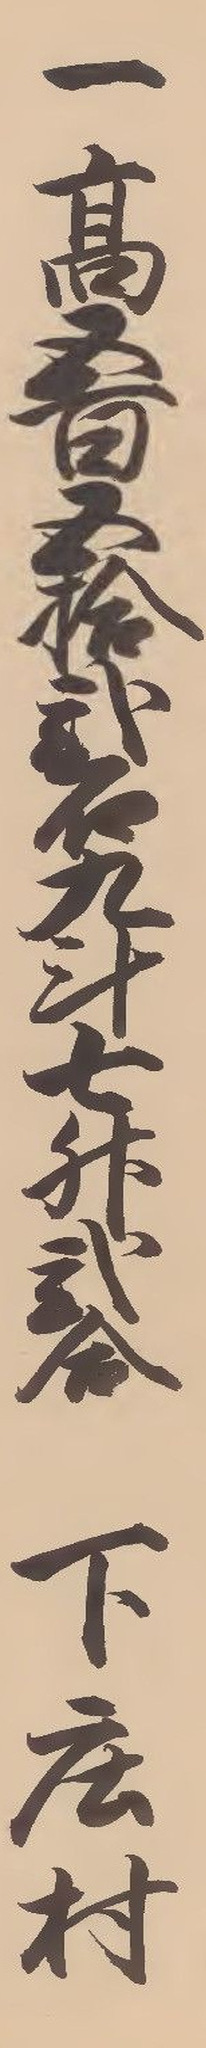一高五百五拾弐石九斗七升弐合下庄村
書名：美作国郷帳
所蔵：国立公文書館 National Archives of Japan
